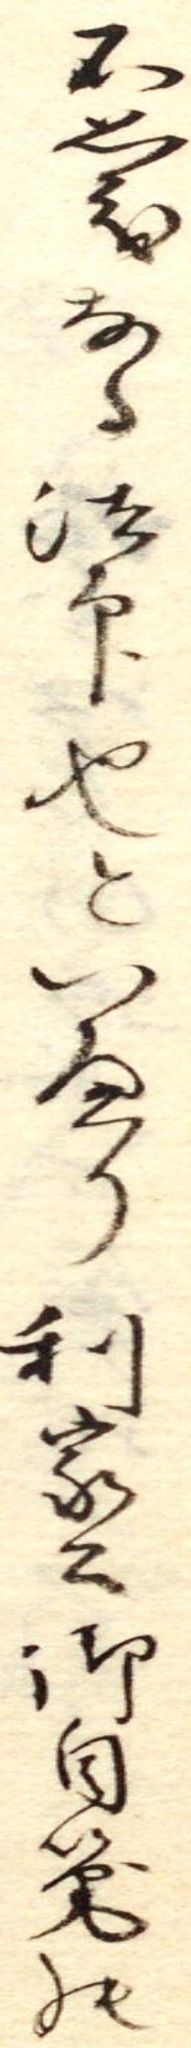不思義なる法印也といへり利家公御自筆の
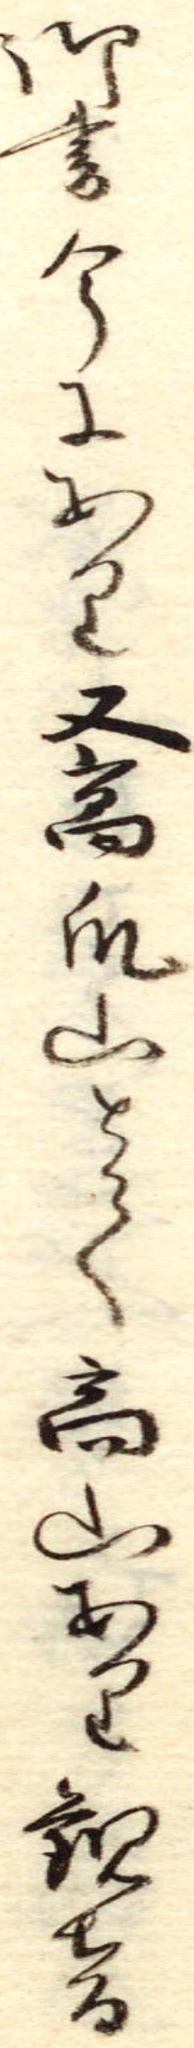御書今にあり又高爪山とて高山あり観音
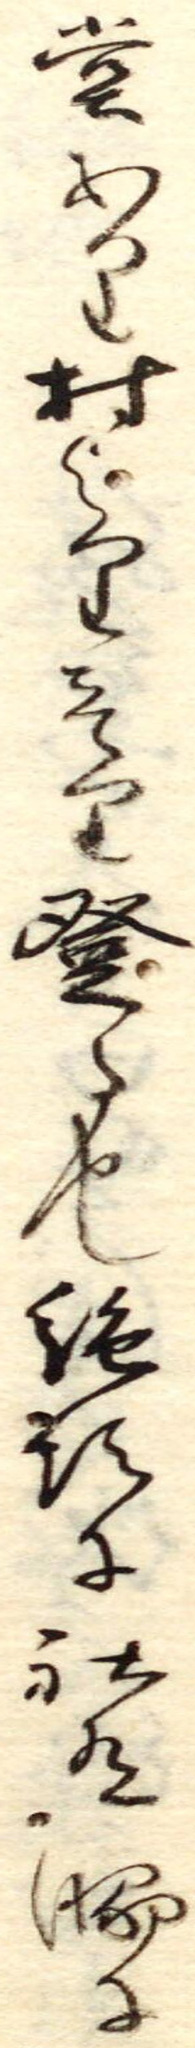堂あり村より壱里登る也絶頂に社有脇に
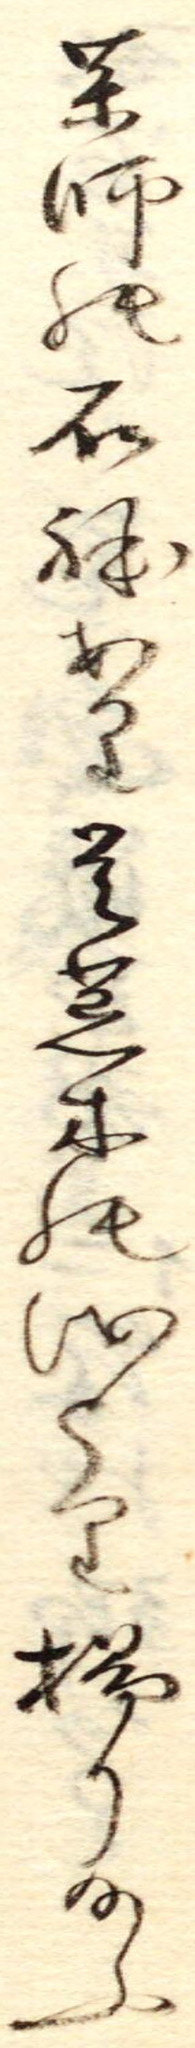薬師の石躰あり是荒木の海より揚り給ふ
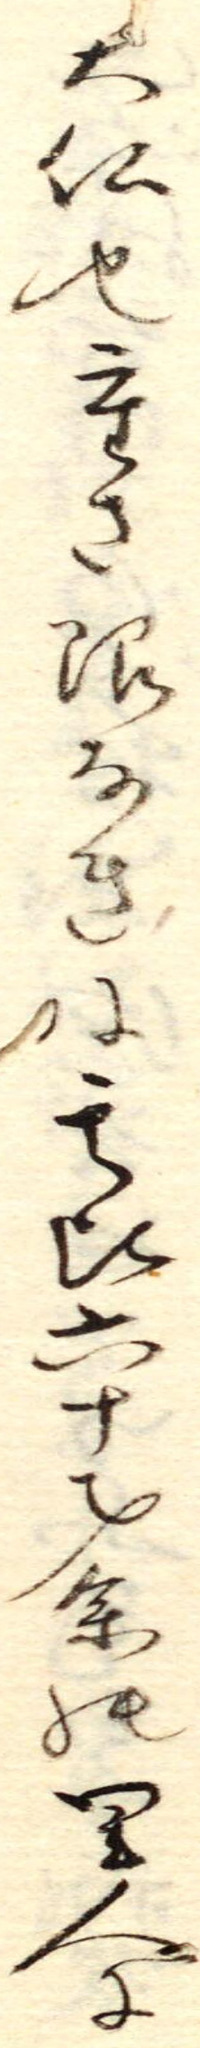大仏也重き限りなきに其比六十才余の里人に
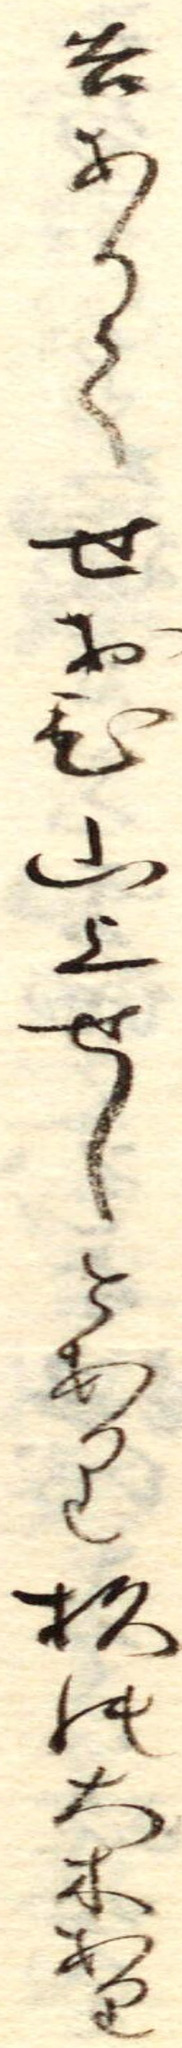告ありてせおひ山上せしとあり杦の大木あり
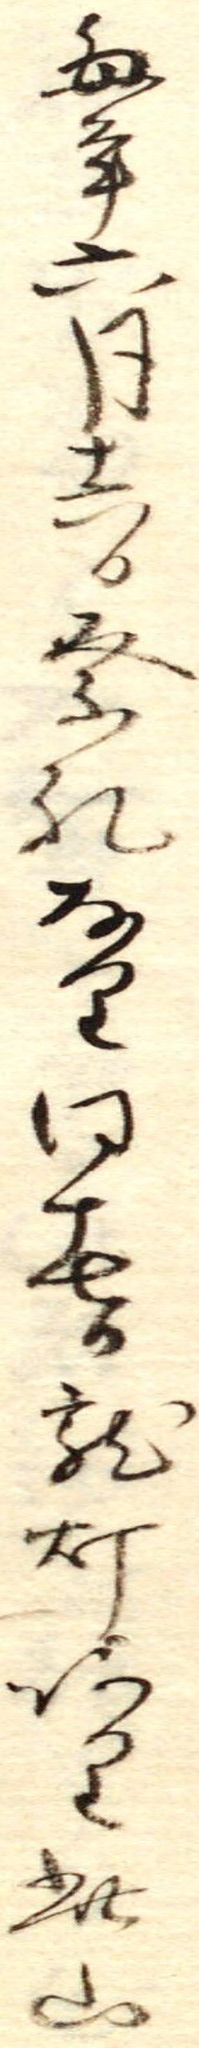毎年六月十六日祭礼なり同十七日龍灯あり此山
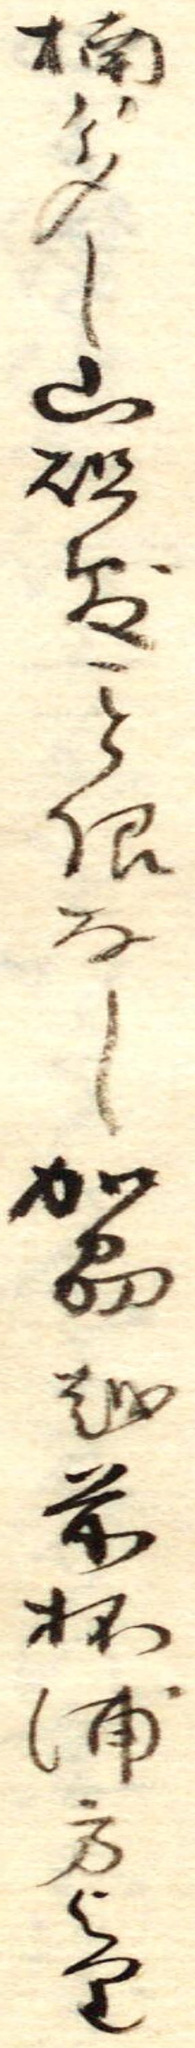楠多し山岨敷こと限なし加州越前抔浦方より
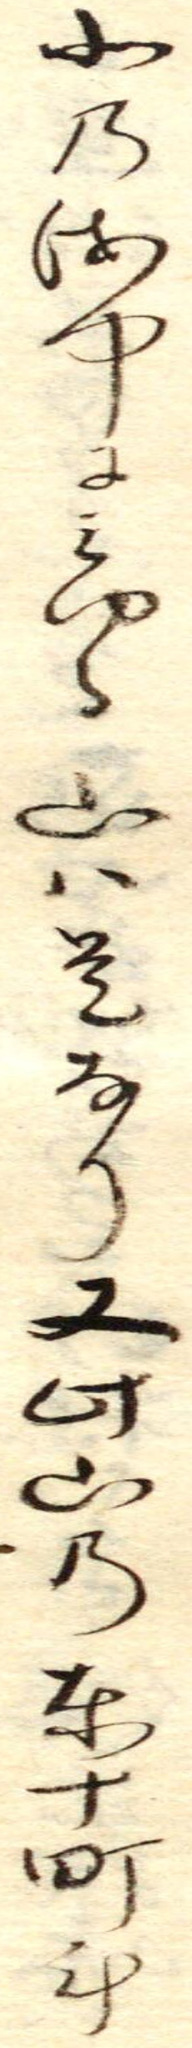北の海中にみゆる山は是なり又此山の東十町計

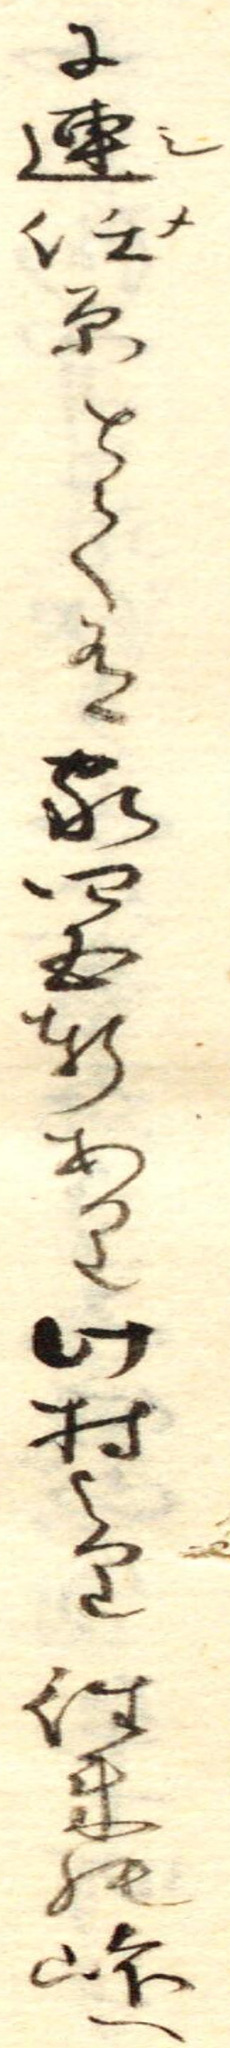に連任原とて有家四五軒あり此村より往来の峠へ
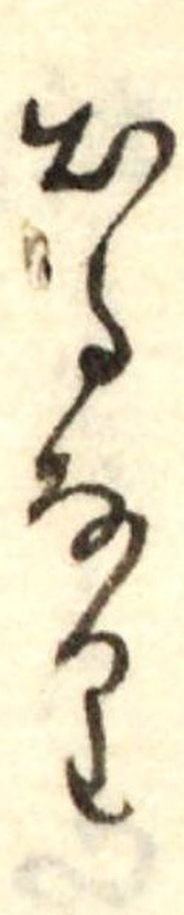出るなり
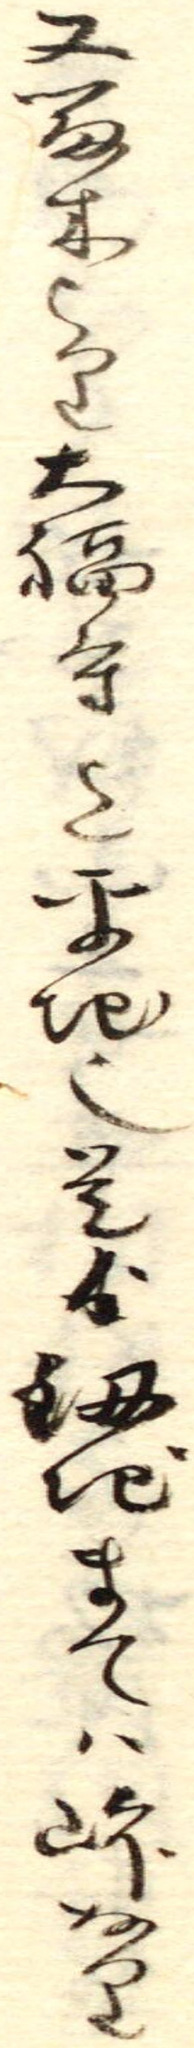又留木より大福寺迄平地也是ゟ釼地まては峠なり
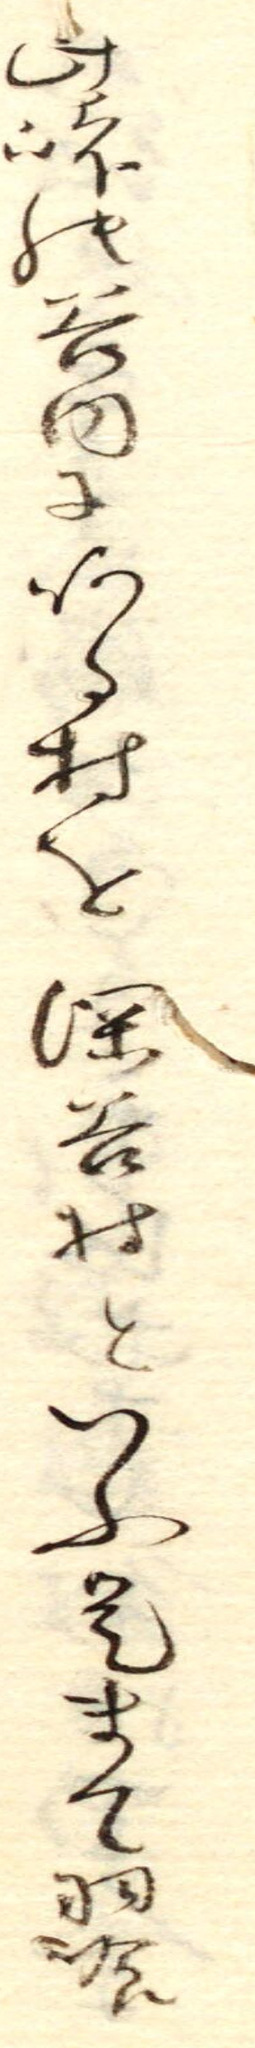此峠の谷内にある村を岡谷村といふ是まて羽喰
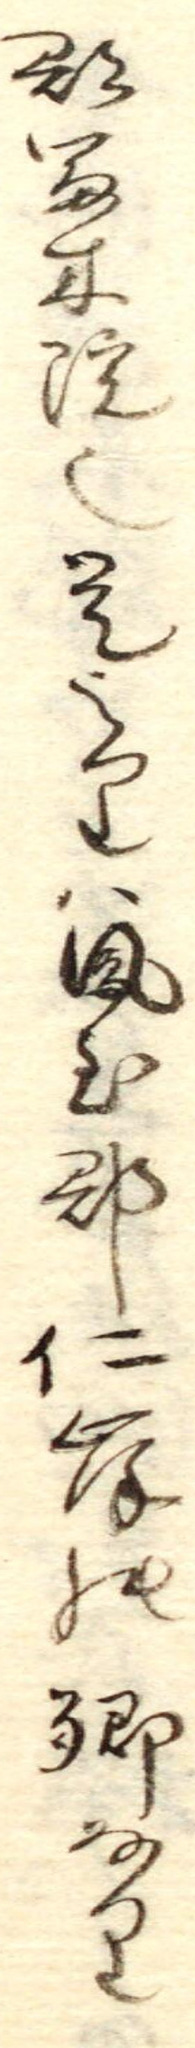郡冨木院也是よりはふげし鳳至郡仁岸の郷なり
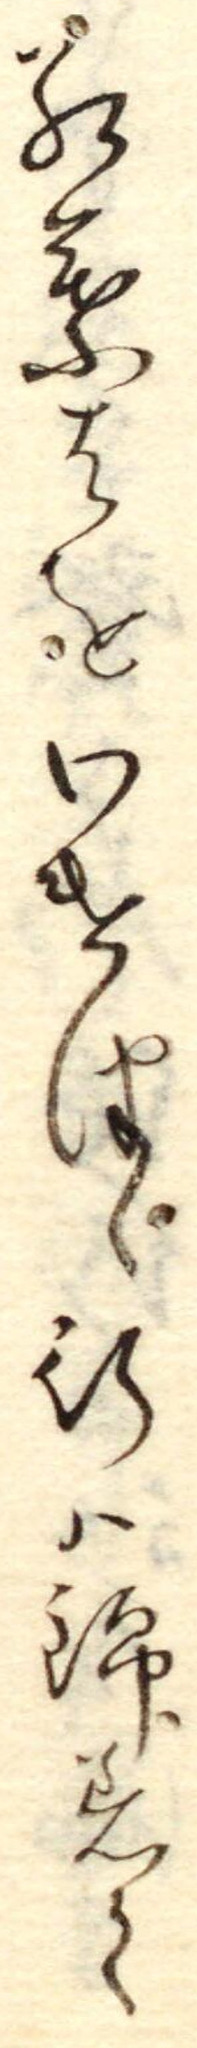若葉其をわけつゝ行は錦着て
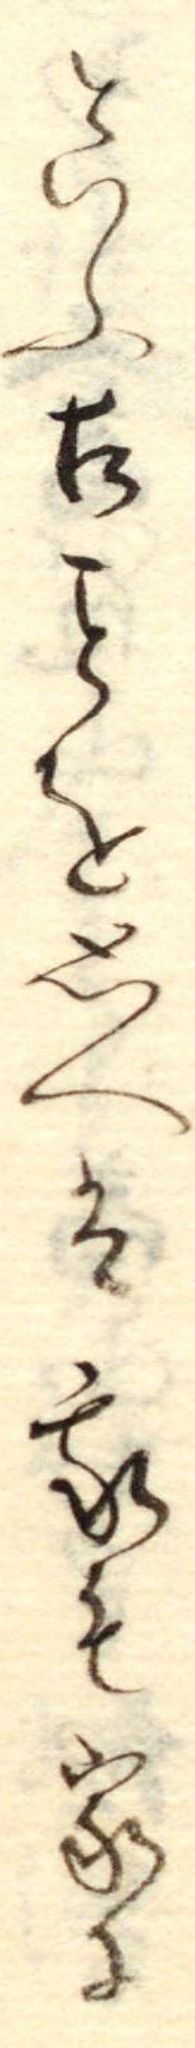といふ古ことを思へは我も家に
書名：能登名跡誌
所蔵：Ishikawa Prefectural Library
